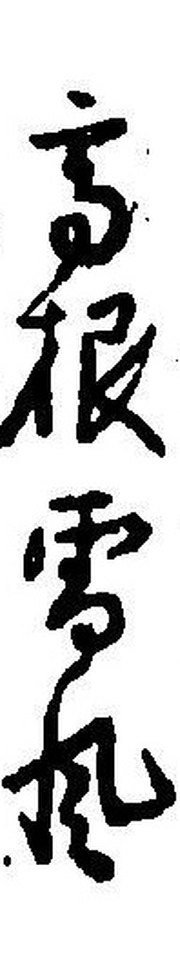高根雪風
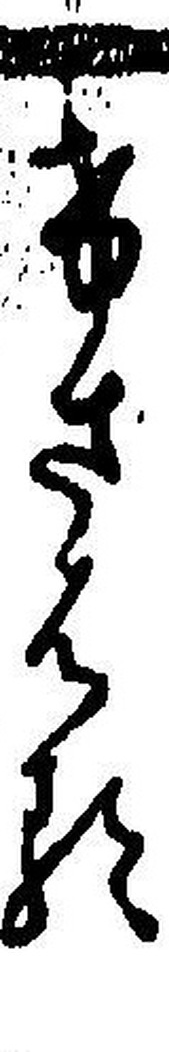けさはる
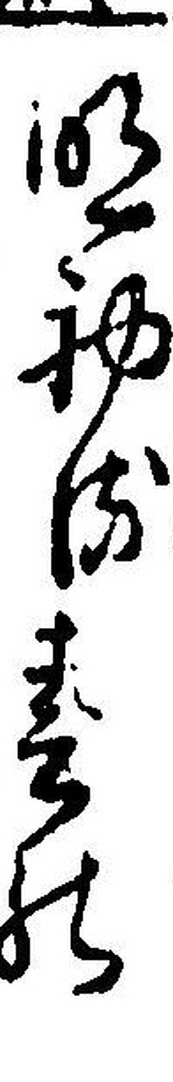明初る春の
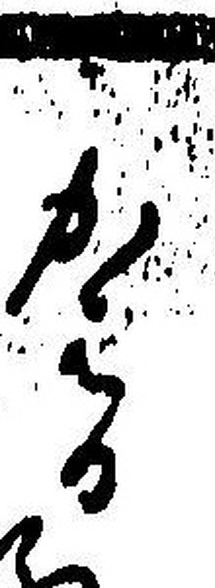かはる
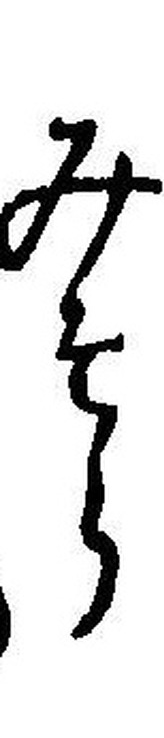みそら
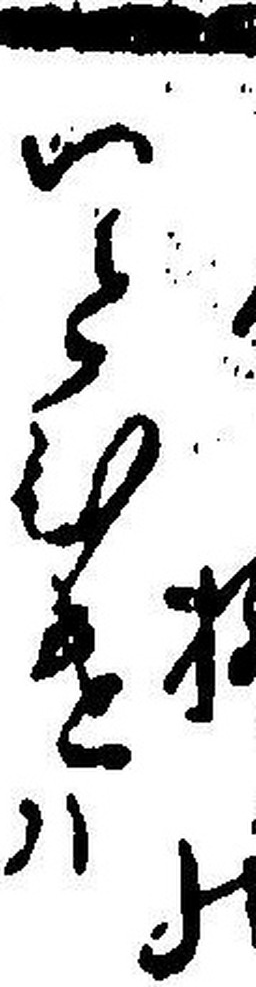いとひけは
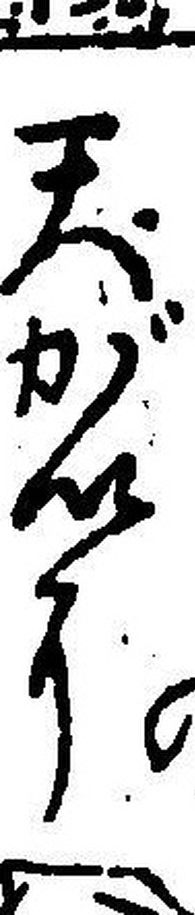天がいに
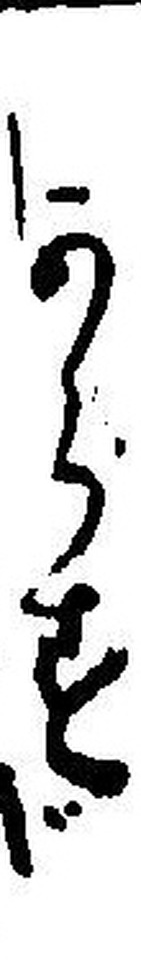からす
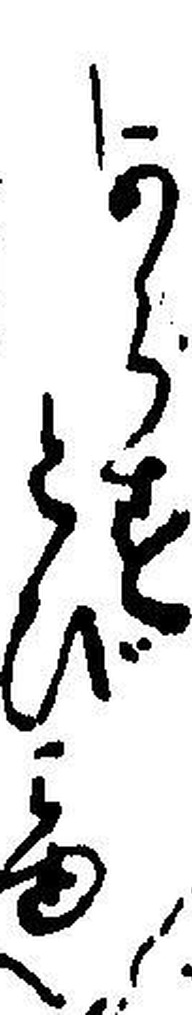からす
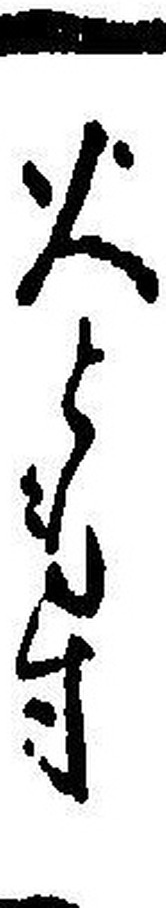火ともす
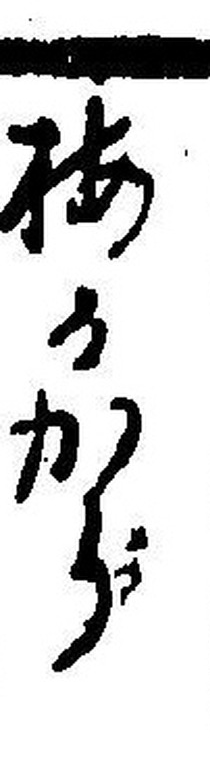梅かから
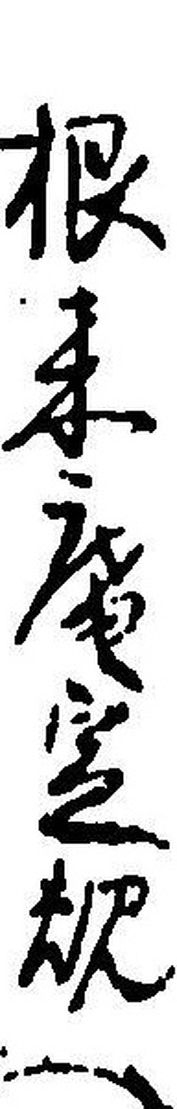根来庵定規
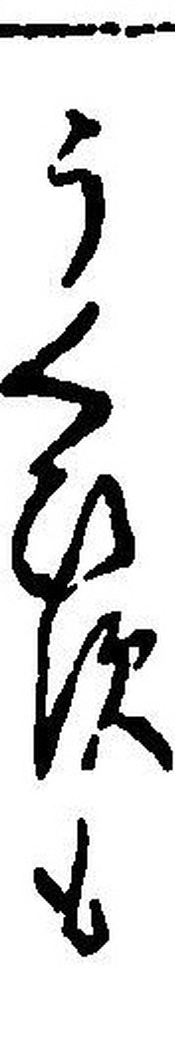うくひすも
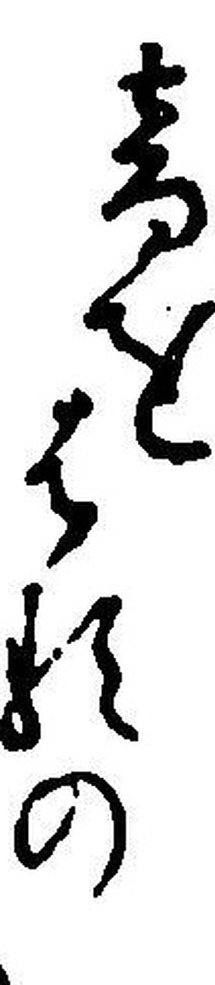はるの
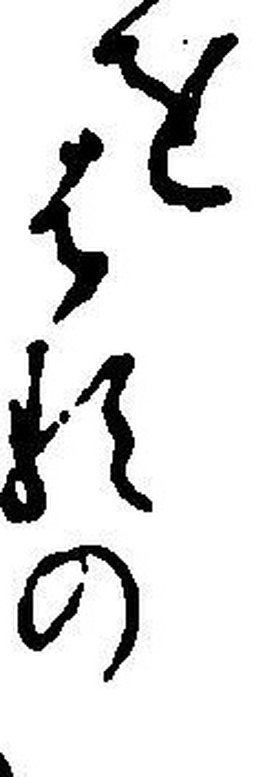はるの
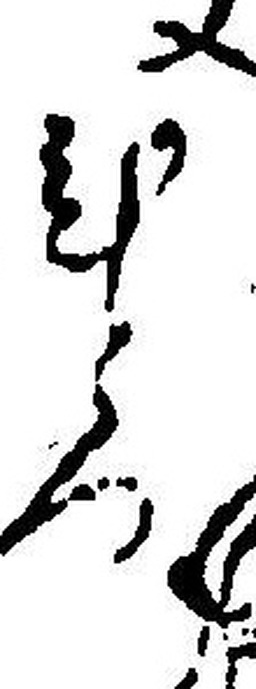ひとつ
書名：どうれ百人一首 / 鹿都部真顔(狂歌堂)編
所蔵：東京大学総合図書館 General Library in the University of Tokyo, JAPAN
